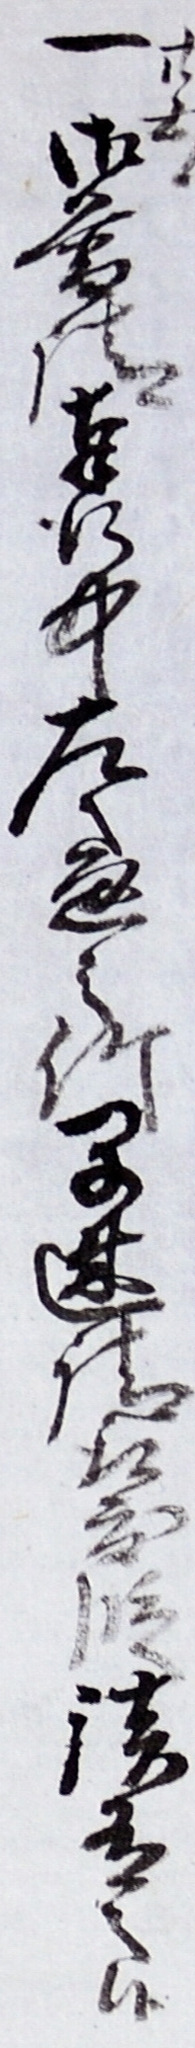一御普請奉行中左之通之竹早速請取度段談有之候
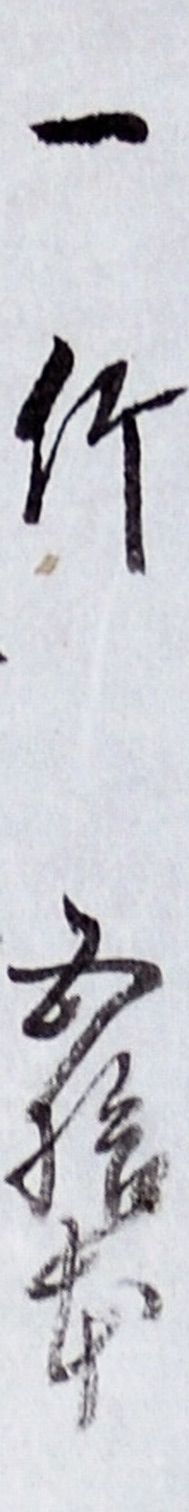一竹五拾本
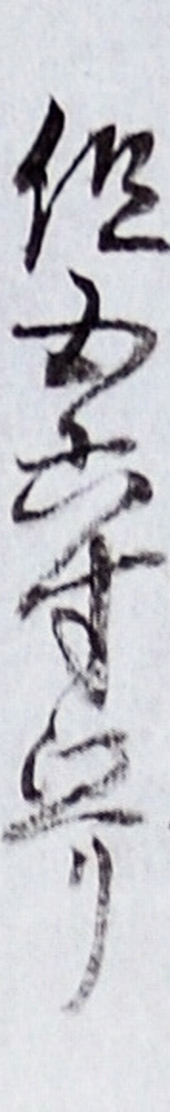但五六寸廻り
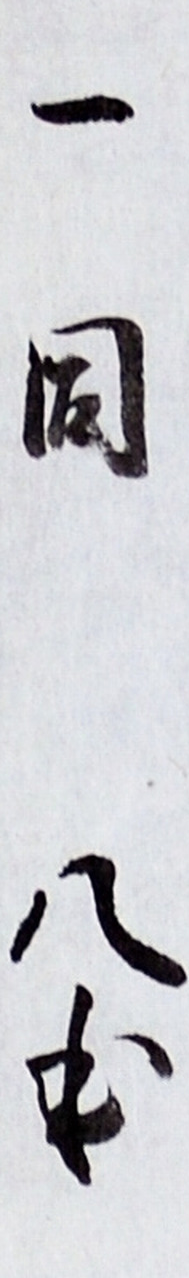一同八本
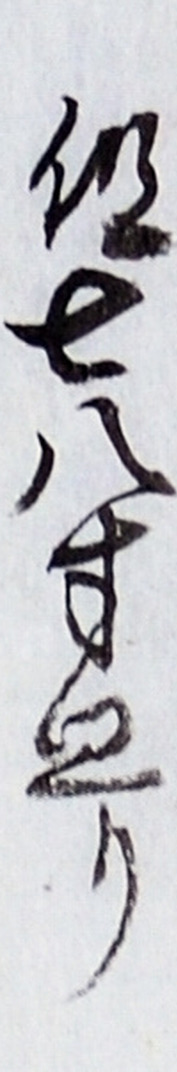但七八寸廻り
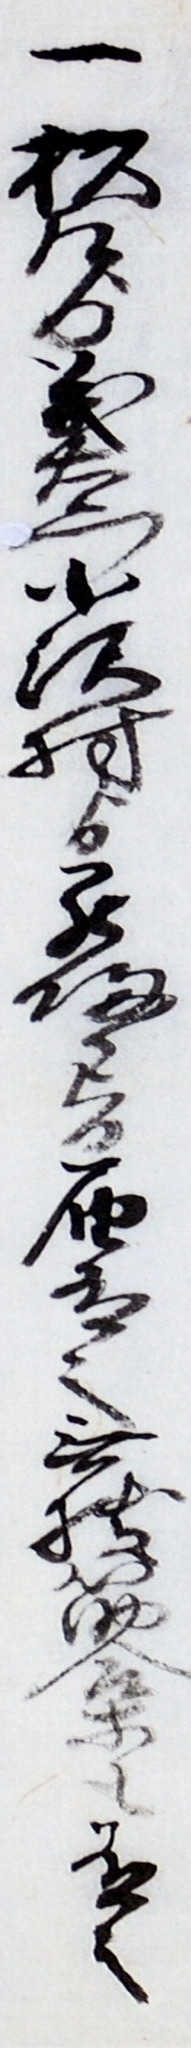一杉左衛義右衛門小沢村より罷帰候旨届有之無拠筋合等も有之
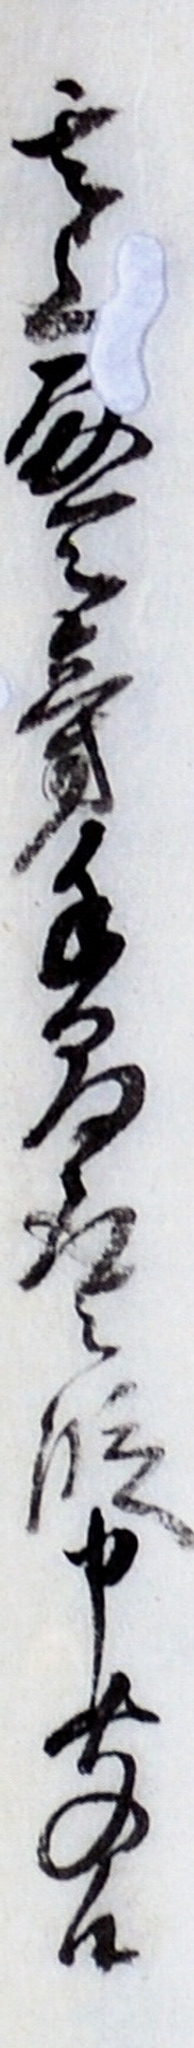其上通之旁手間取之段申聞候
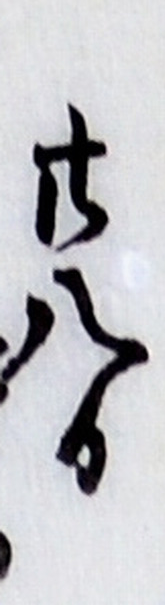廿八日
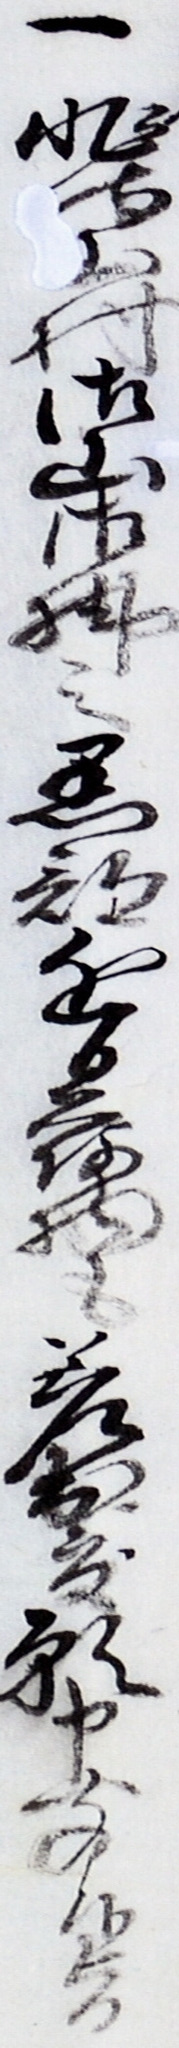一非持山村御山御払之黒部近日荷物は差出度願申聞候旨
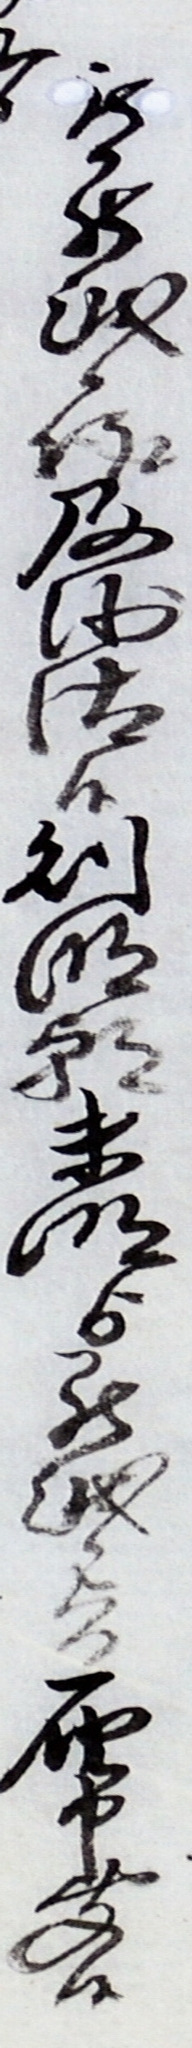被罷越候様及沙汰候則明朝未明より罷越候旨届申聞候
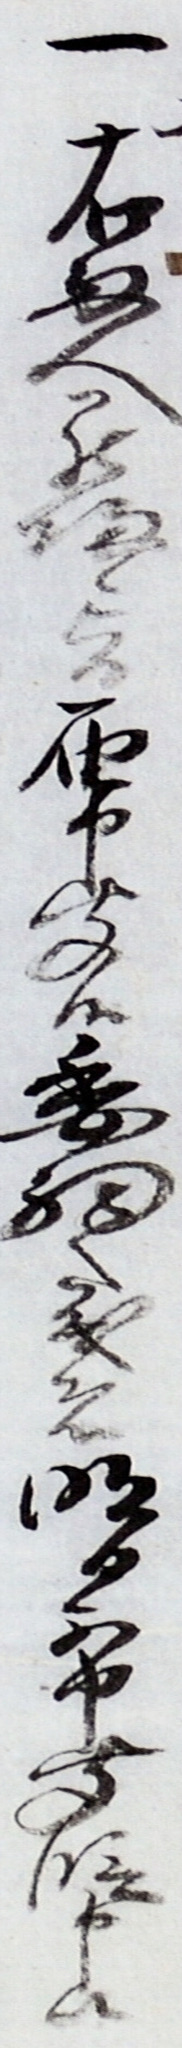一右両人罷帰候旨届申聞候委細之義者明日可申聞段申候
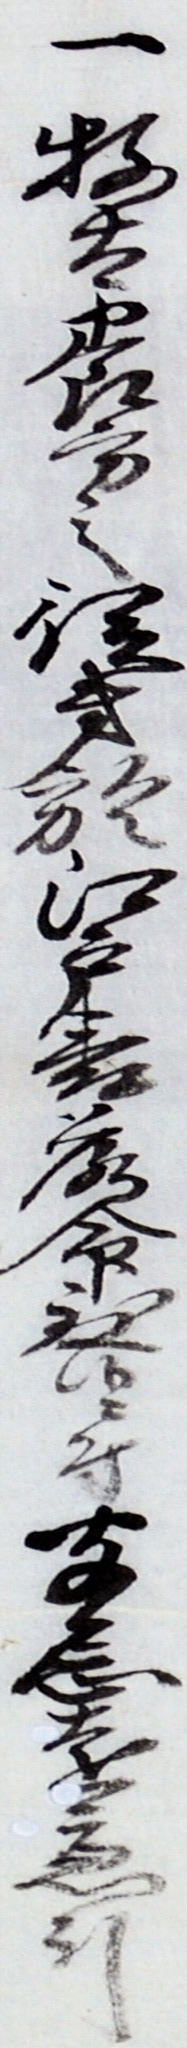一牧太養方之従弟於江戸表落命致候ニ付聞忌遠慮引
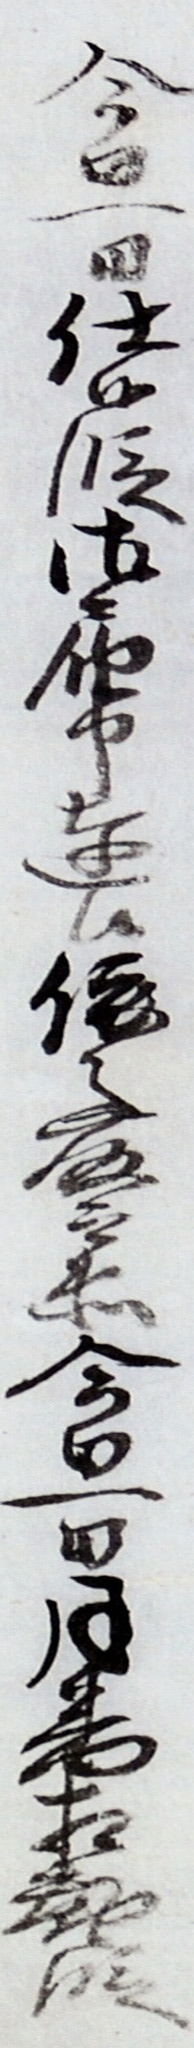一今日一日仕候段御届申達候依之藤兵衛今日一日月番相勤候段
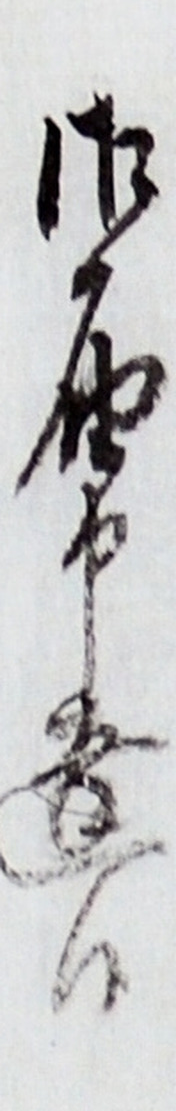御届申達候

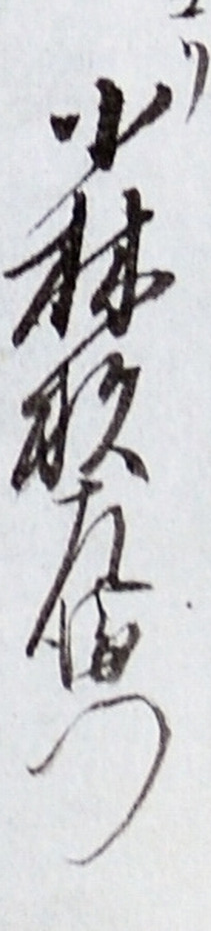小林杉左衛門
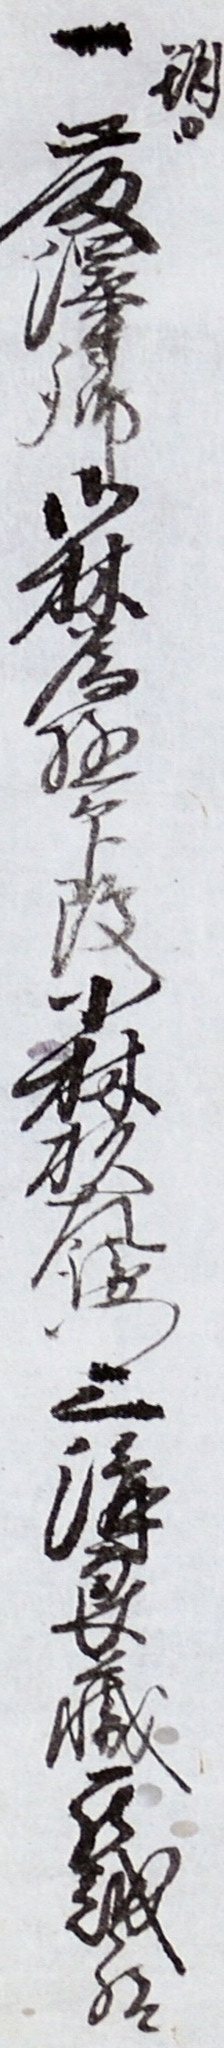一藤澤郷御林為極印改小林杉八左衛門三溝長蔵罷越水
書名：御山奉行御用控
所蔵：伊那市立高遠町図書館・合同会社AMANE
